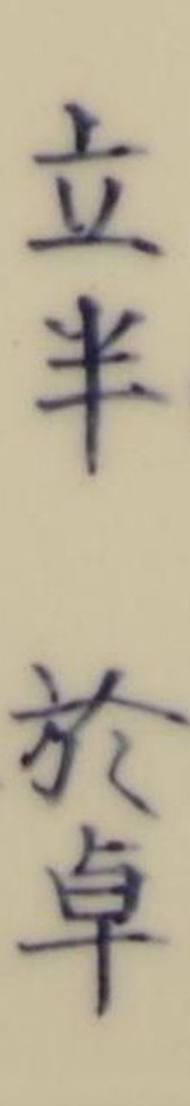立半於卓
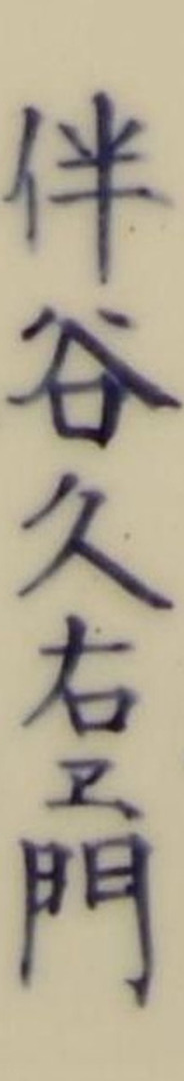伴谷久右ヱ門
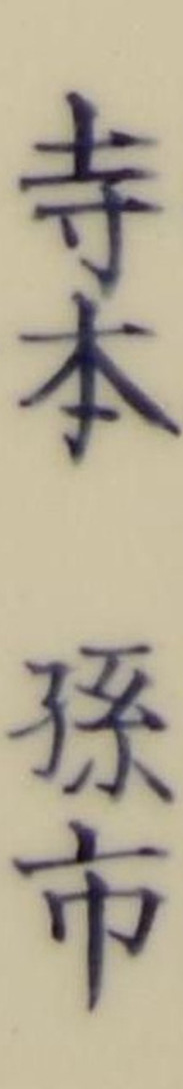寺本孫市
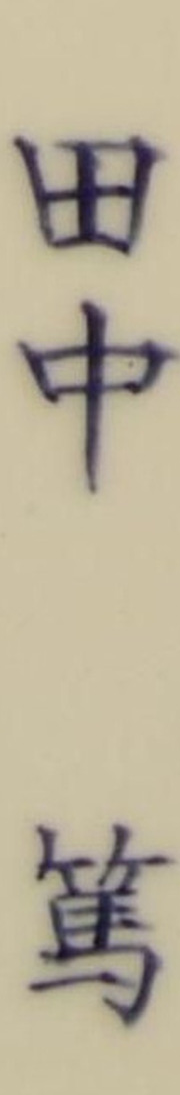田中篤
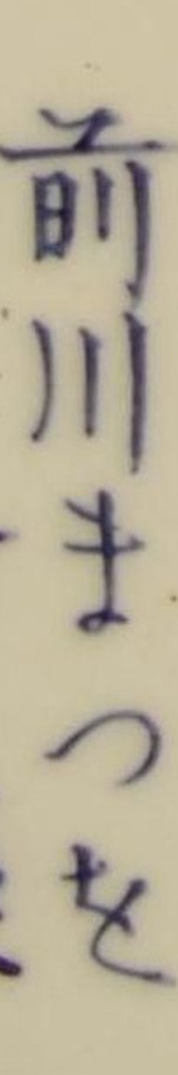前川まつを
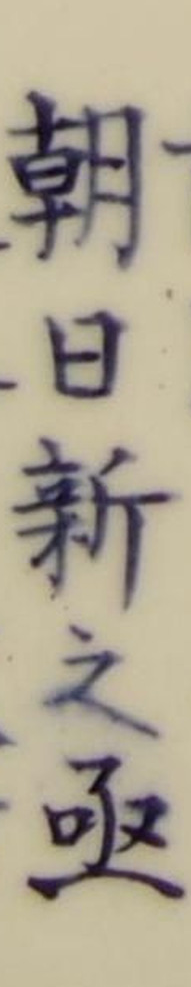朝日新之丞
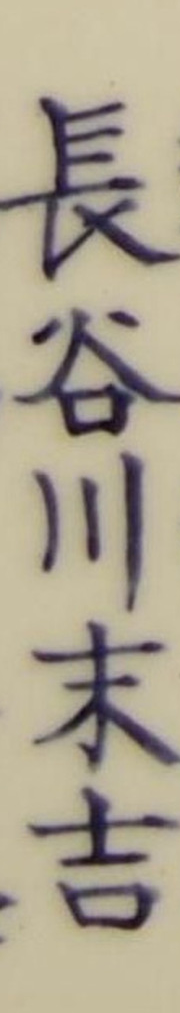長谷川末吉
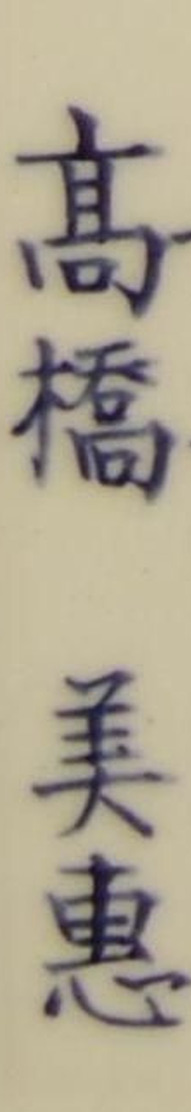高橋美恵

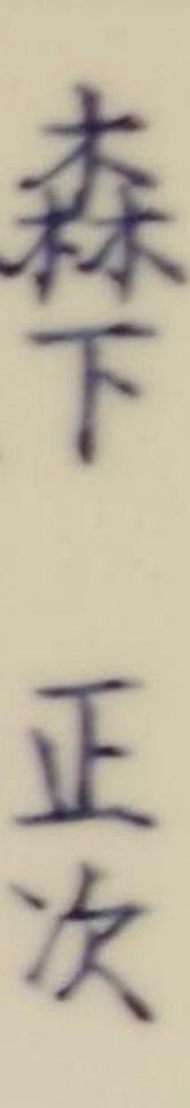森下正次
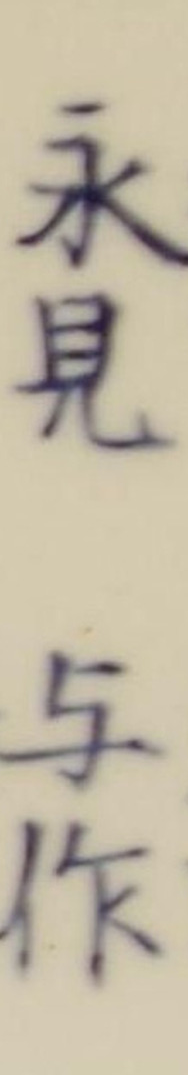永見与作
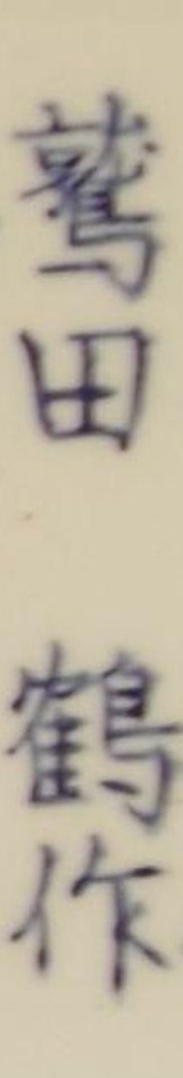鷲田鶴作
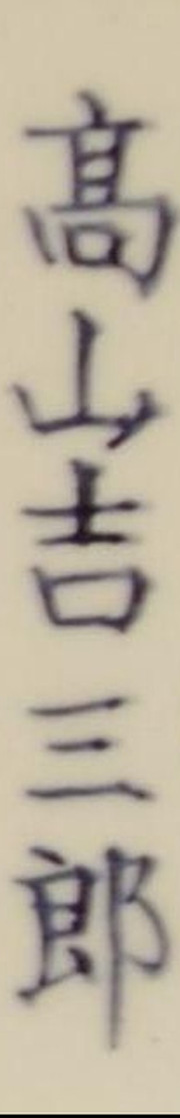高山吉三郎
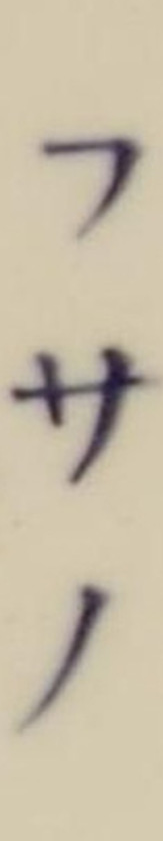フサノ
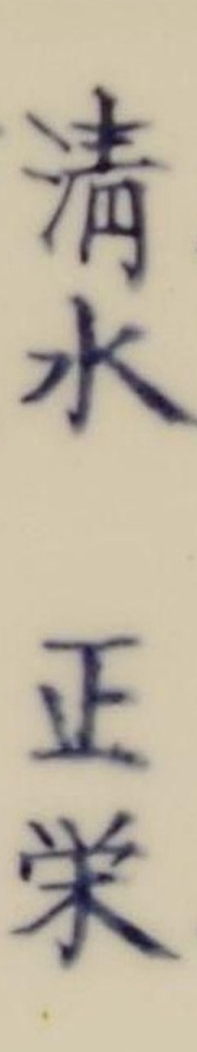清水正栄
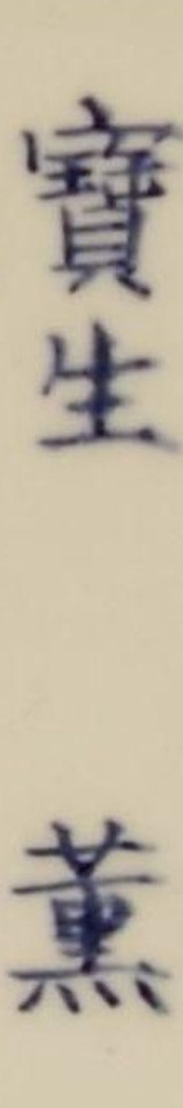宝生薫
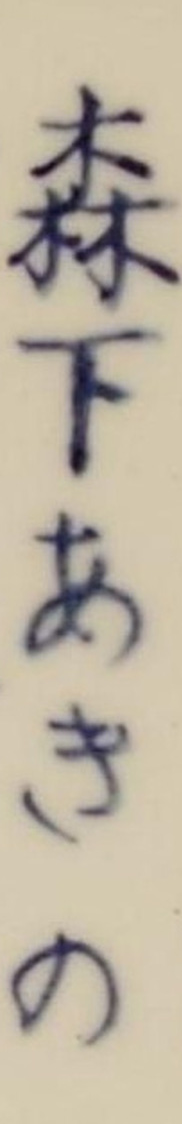森下あきの
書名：E~L
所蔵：高野山金剛峯寺
